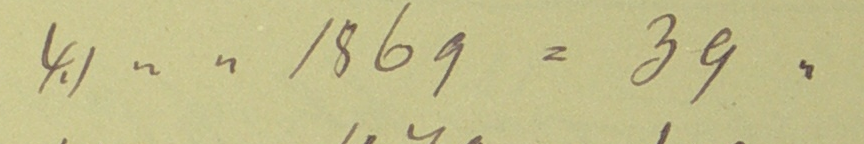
4) * 1869 = 29 *
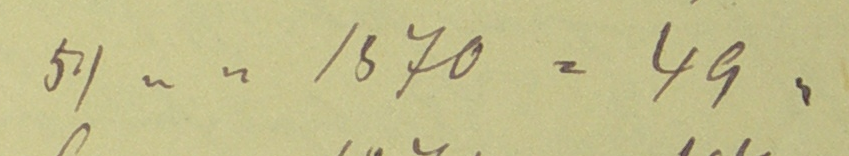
5) * 1870 = 49
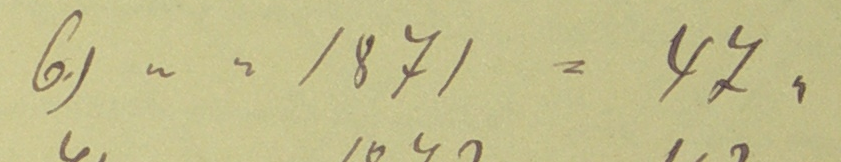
6) * 1871 = 47
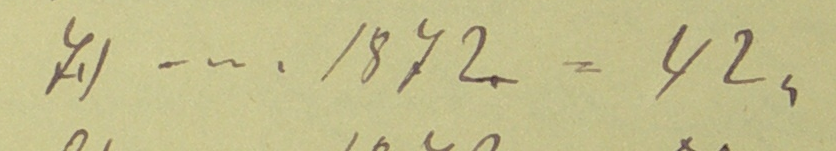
7) * 1872 = 42
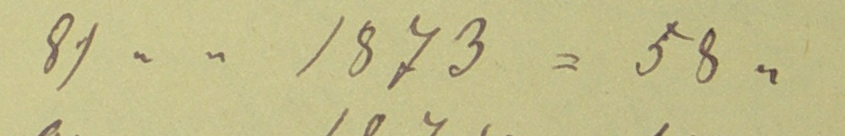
8) * 1873 = 58
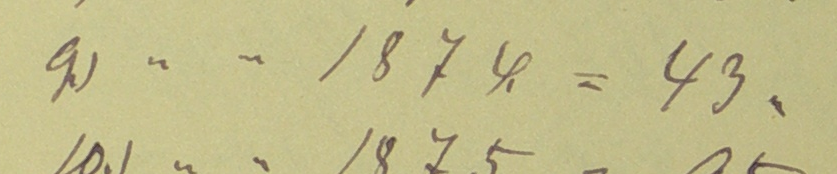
9) * 1874 = 43
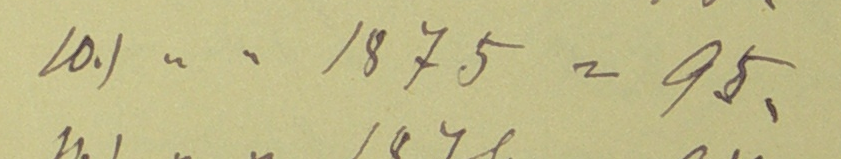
10) * 1875 = 95
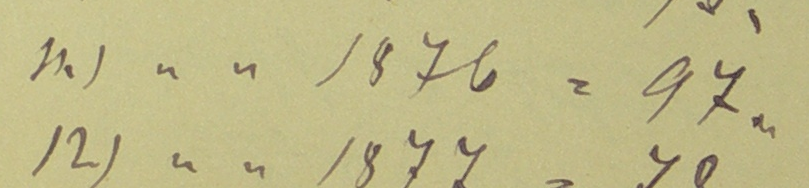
11) * 1876 = 97
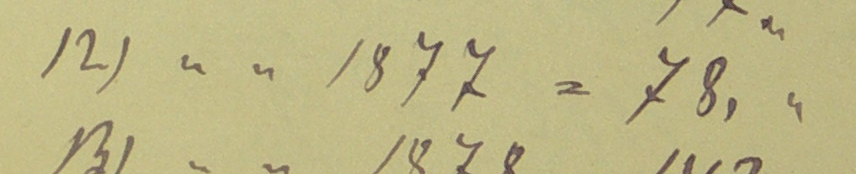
12) * 1877 = 78
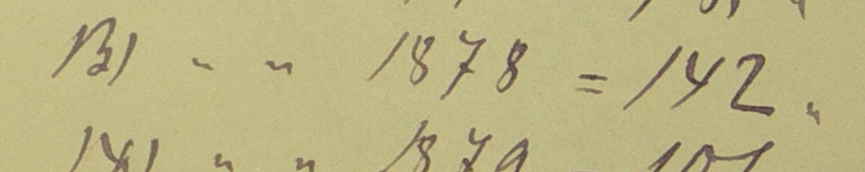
13) * 1878 = 142
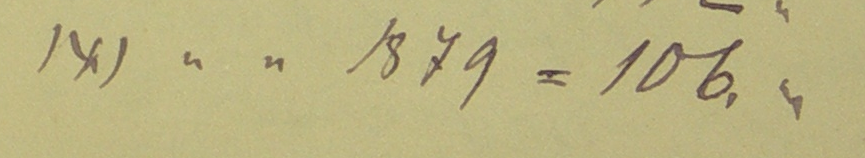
14) * 1879 = 106
